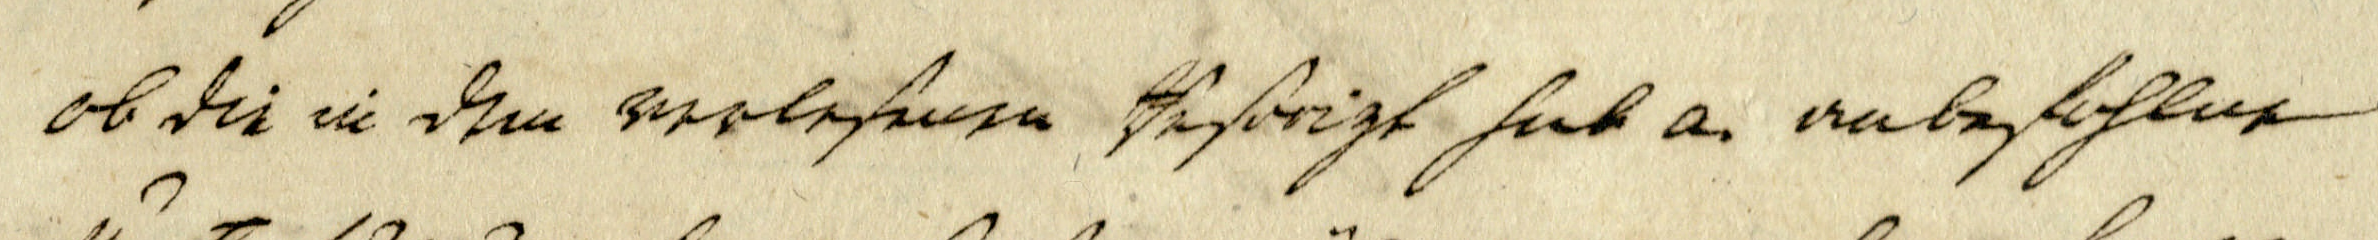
ob die in dem verlesenen Rescript sub a. anbefohlne
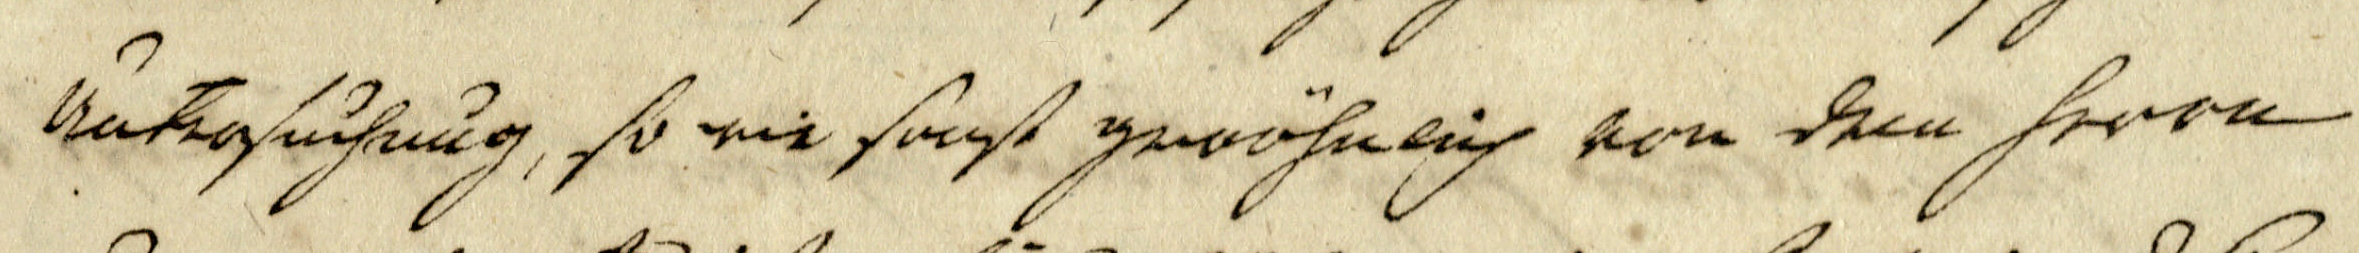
Untersuchung, so wie sonst gewöhnlich von dem Herrn
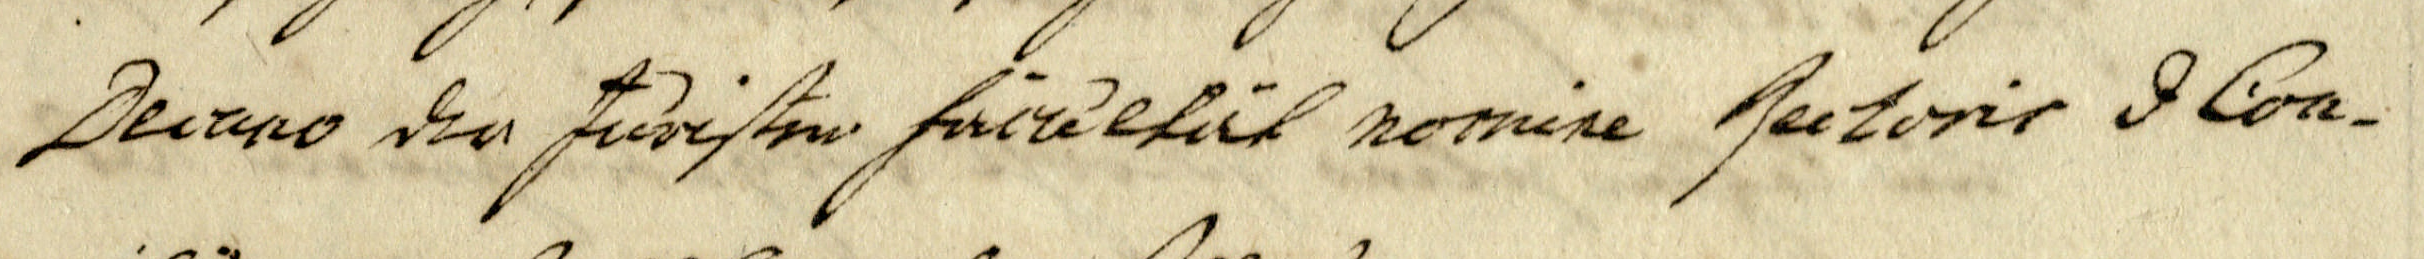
Decano der Juristen Facultät nomine Rectoris et Con¬
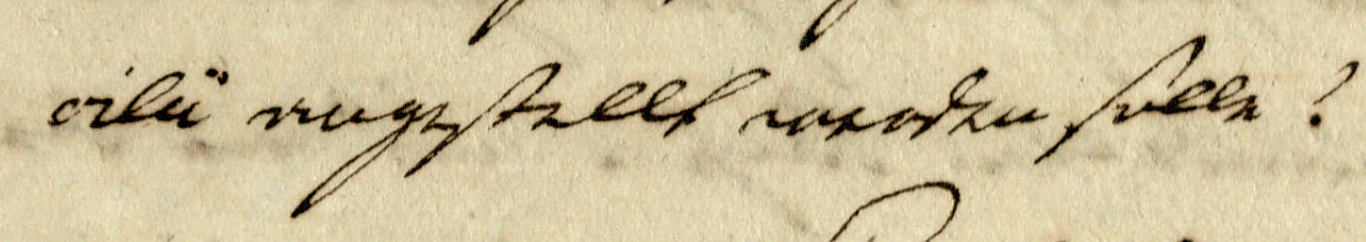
cilii angestellt werden solle?
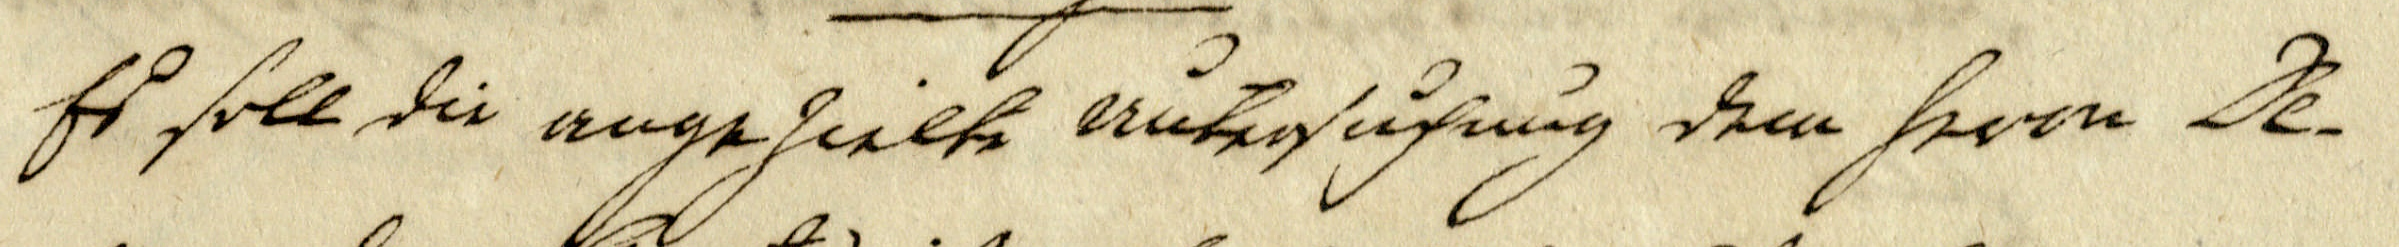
Es soll die angezielte Untersuchung dem Herrn De¬
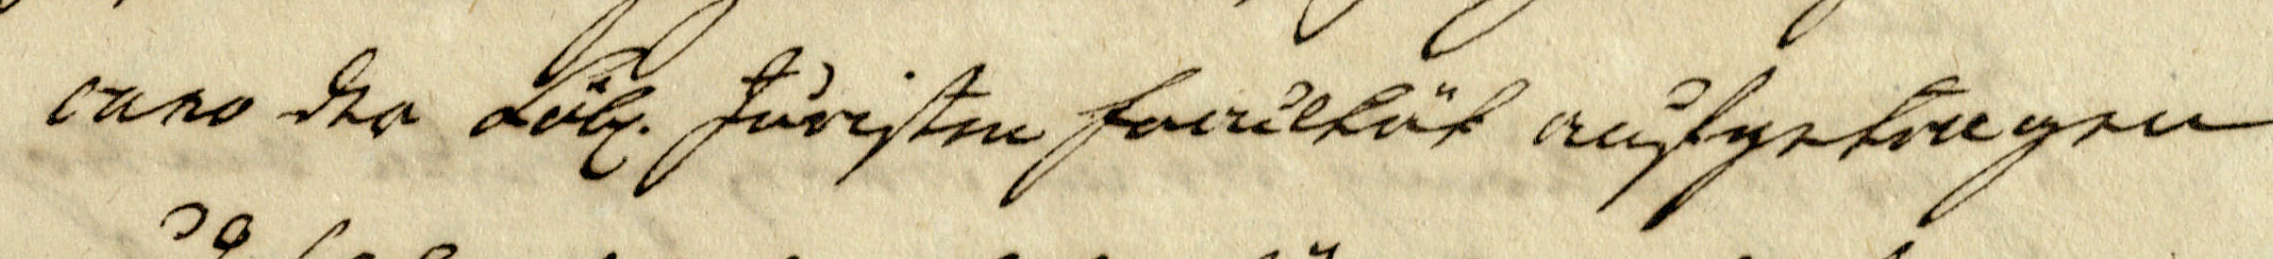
cano der Löbl. Juristen Facultät aufgetragen
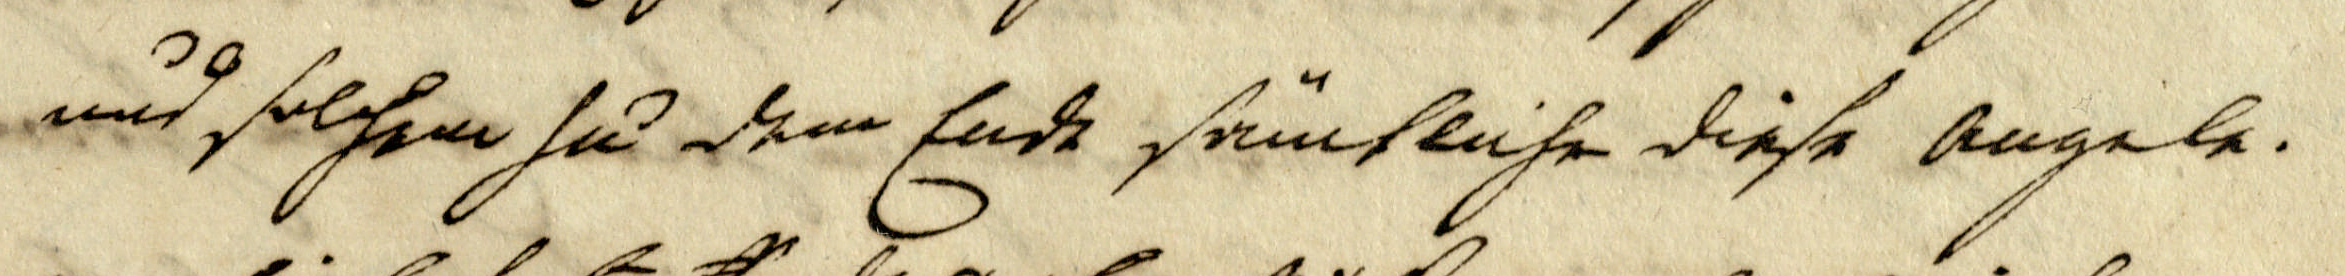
und solchem zu dem Ende sämtliche diese Angele¬
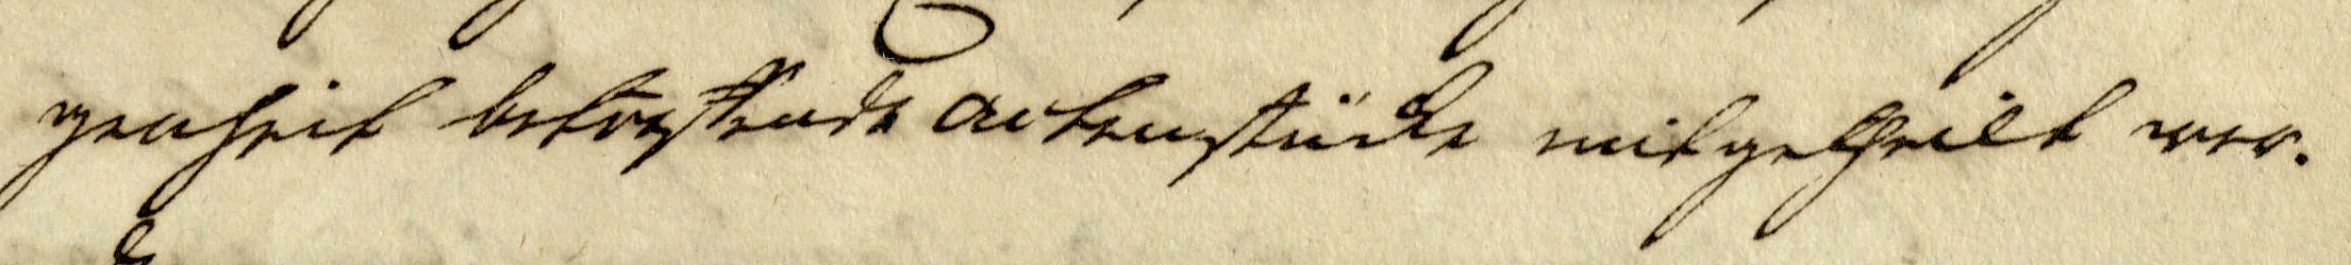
genheit betreffende Actenstücke mitgetheilt wer¬
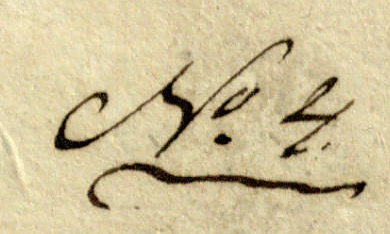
No 4.
